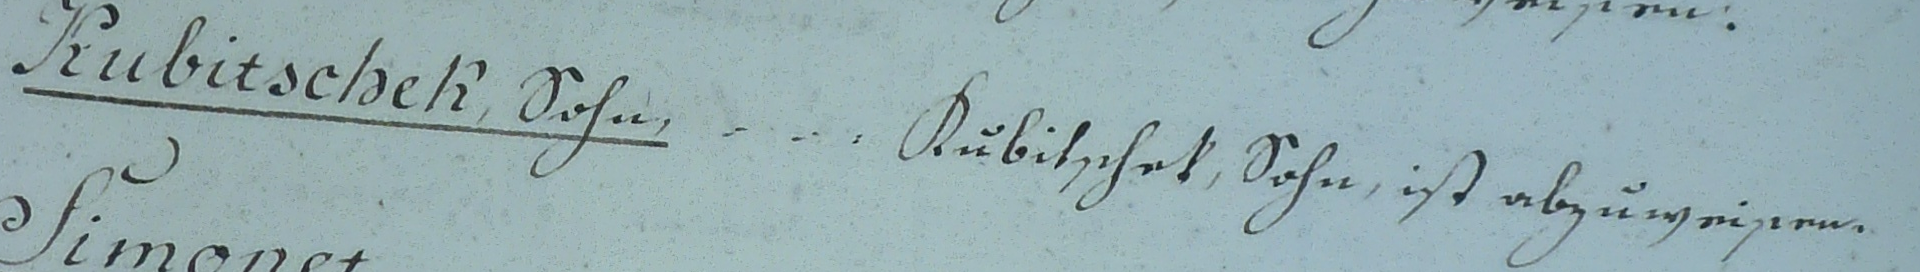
Kubitschek, Sohn, : : : Kubitschek, Sohn, ist abzuweisen.
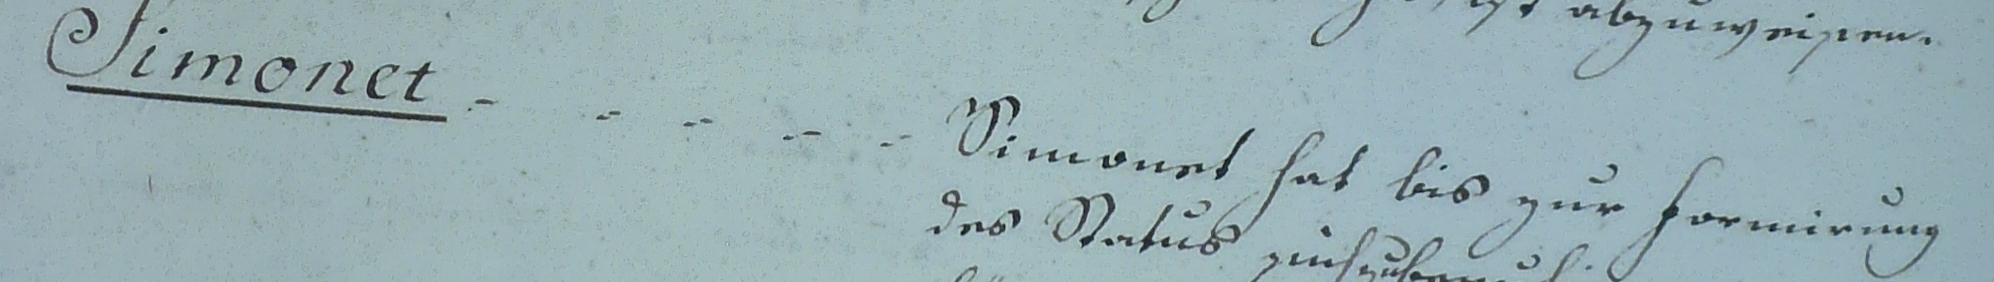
Simonet : : : : : Simonet hat bis zur Formirung
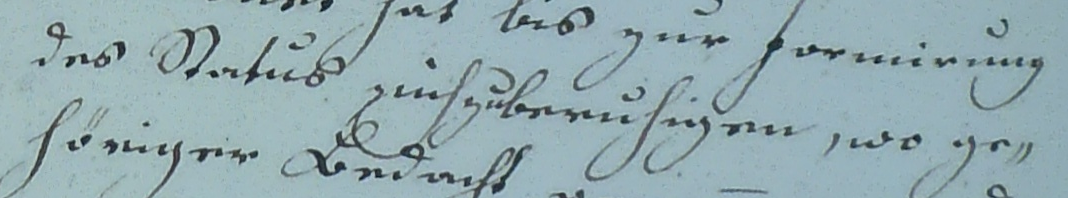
des Status sichzuberuhigen, wo ge¬
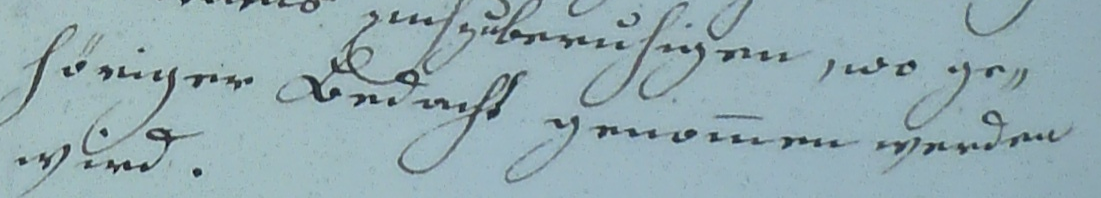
höriger Bedacht genom̅en werden
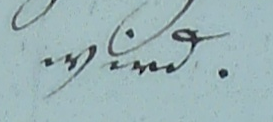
wird.
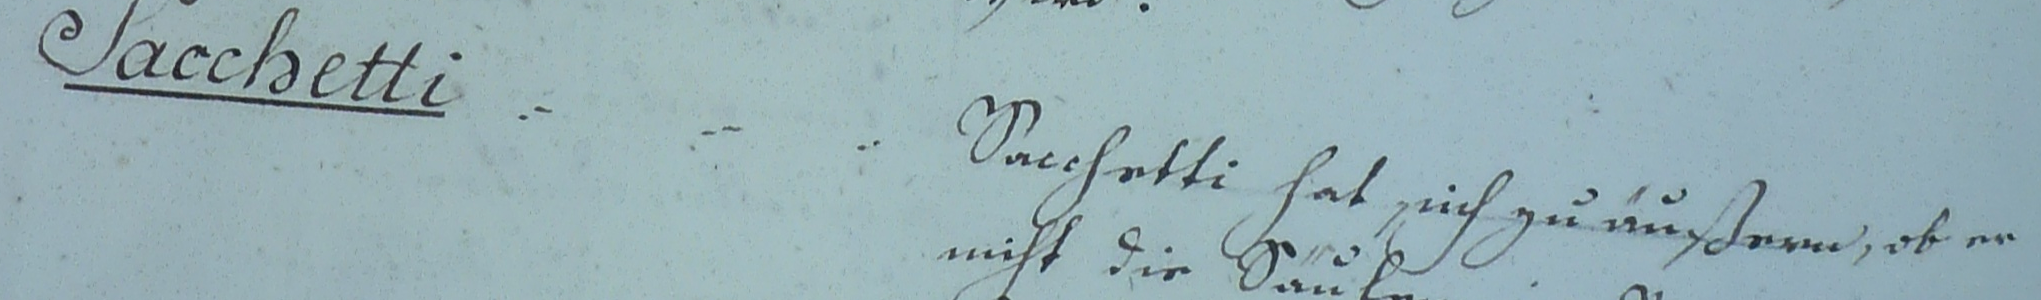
Sacchetti : : : Sacchetti hat sich zu äußern, ob er
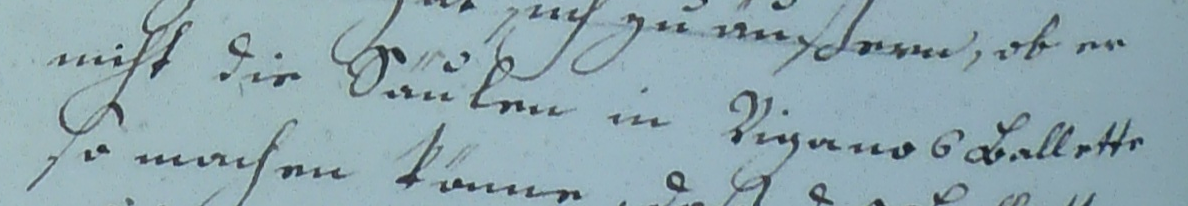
nicht die Säulen in Viganos Ballette
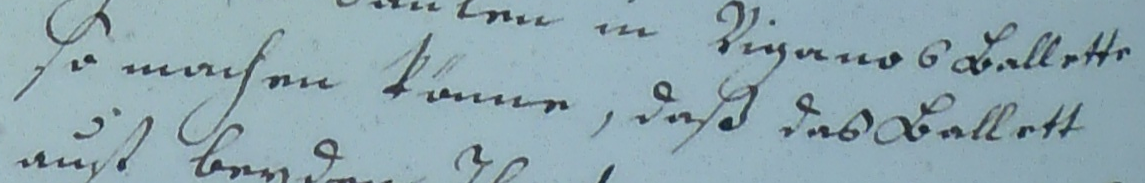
so machen könne, daß das Ballett
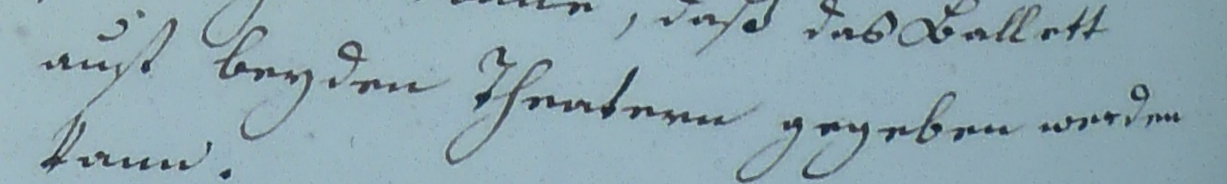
auf beyden Theatern gegeben werden
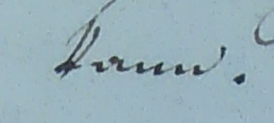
kann.
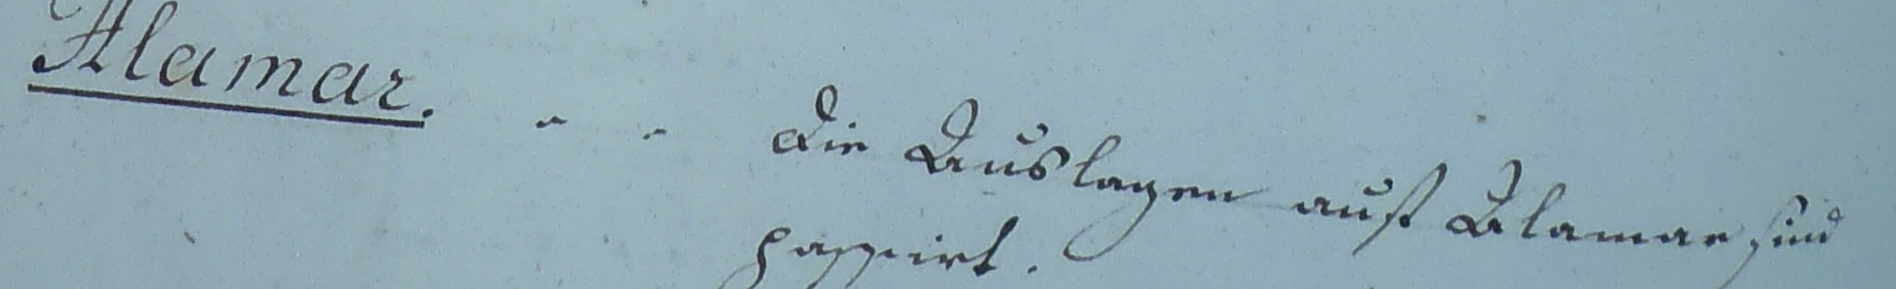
Alamar. : : Die Auslagen auf Alamar sind
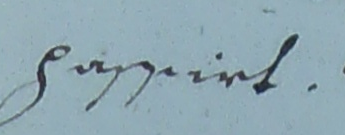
passirt.
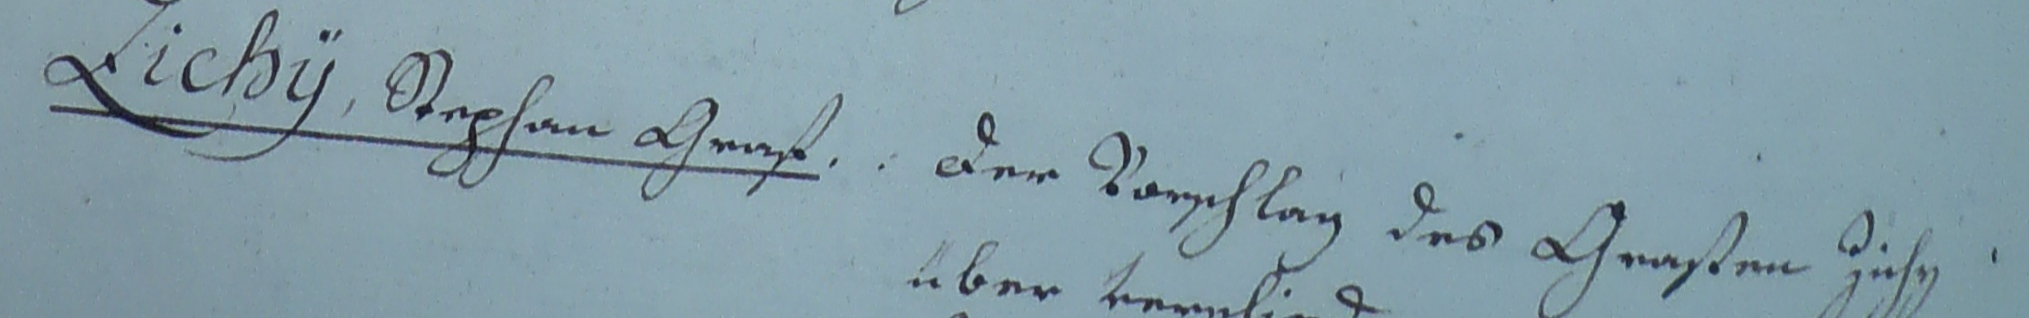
Zichy, Stephan Graf. : Der Vorschlag des Grafen Zichy
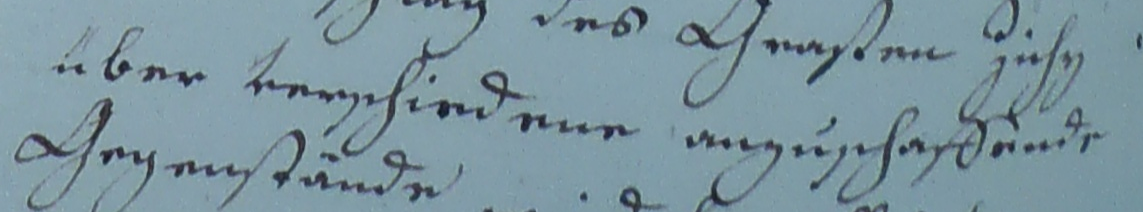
über verschiedene anzuschaffende
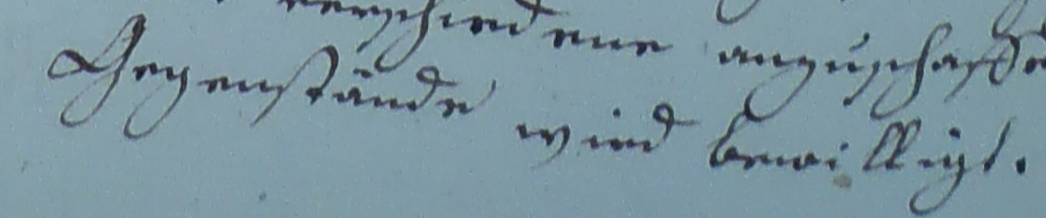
Gegenstände wird bewilligt.
